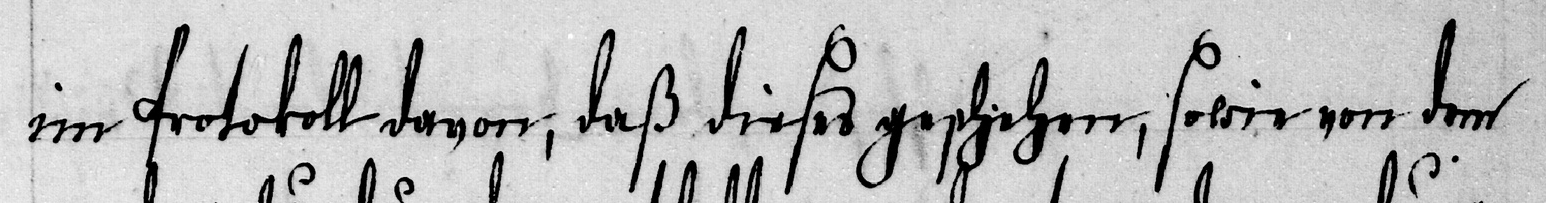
im Protokoll davon, daß dieses geschehen, sowie von dem
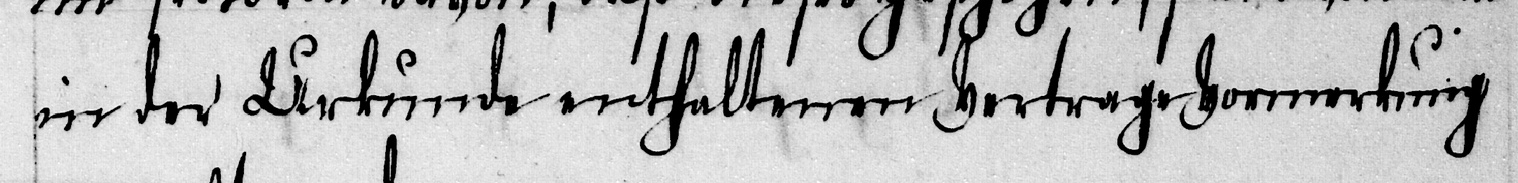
in der Urkunde enthaltenen Vertrage Vormerkung
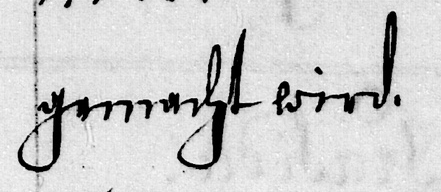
gemacht wird.
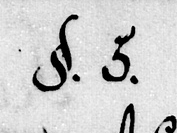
§. 5.
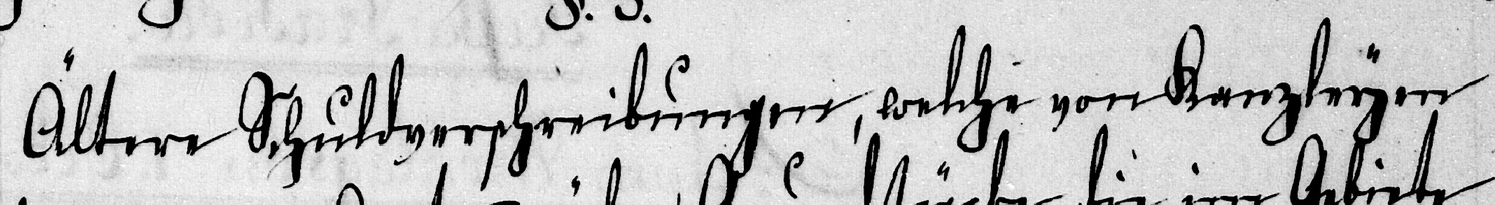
Ältere Schuldverschreibungen, welche von Kanzleyen
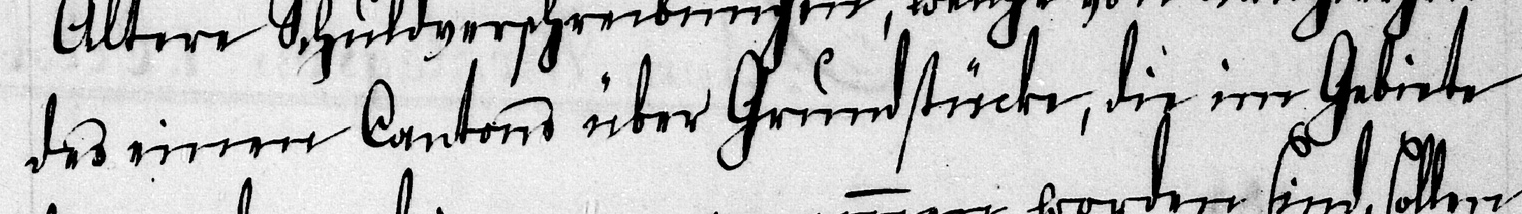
des einen Cantons über Grundstücke, die im Gebiete
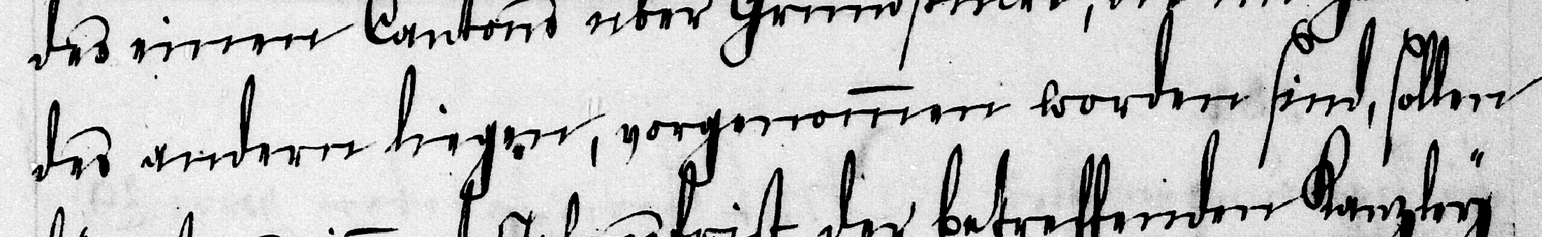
des andern liegen, vorgenommen worden sind, sollen
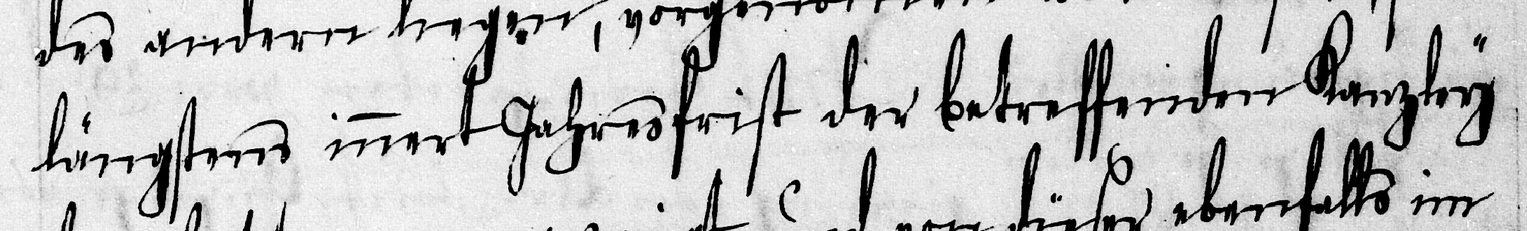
längstens innert Jahresfrist der betreffenden Kanzley
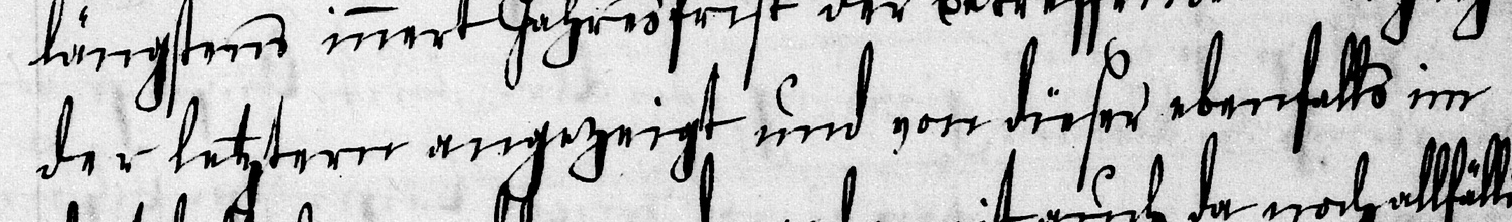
der letztern angezeigt und von dieser ebenfalls im
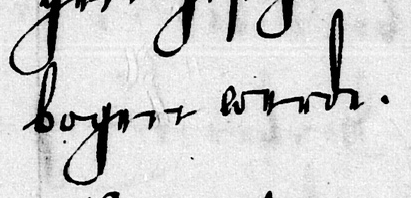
bogen werde.
